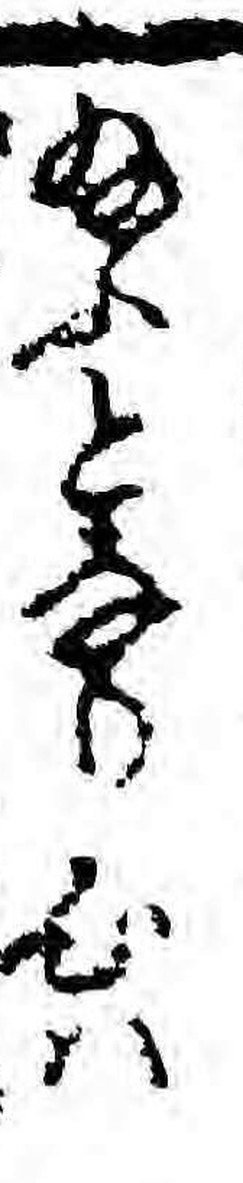給ふとなり心は
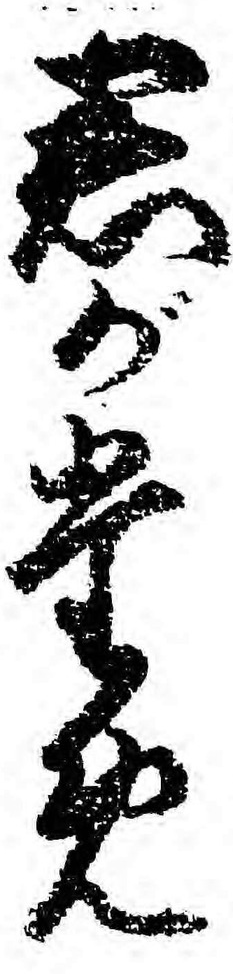君がため
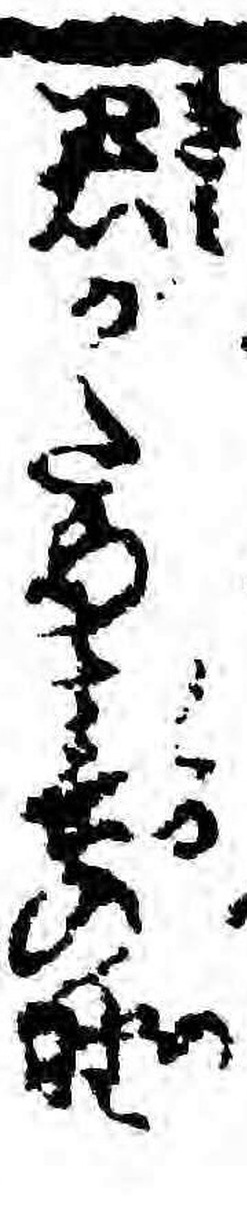君がため春の野
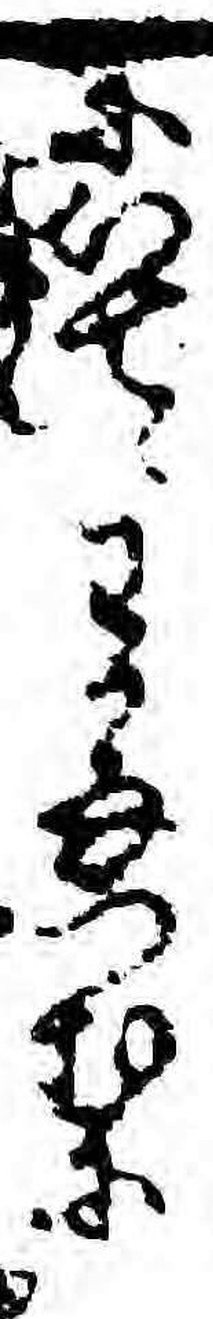にいでゝわかなつむに
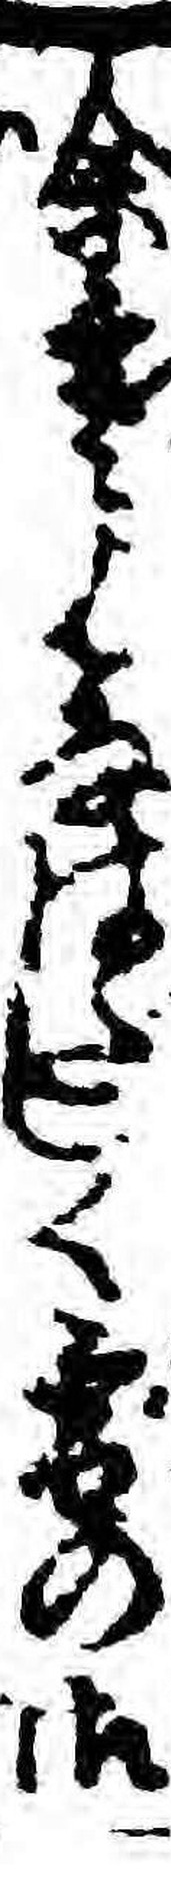余寒はなはだしく雪の御
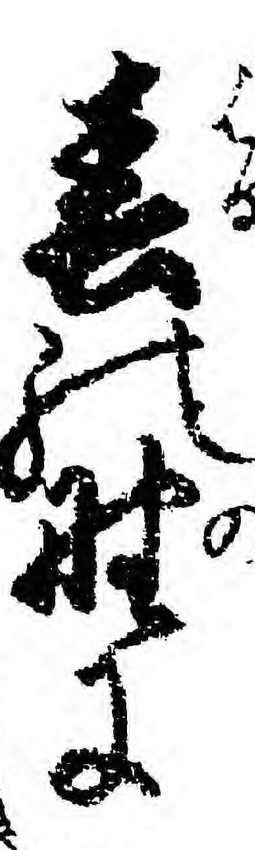春の野に
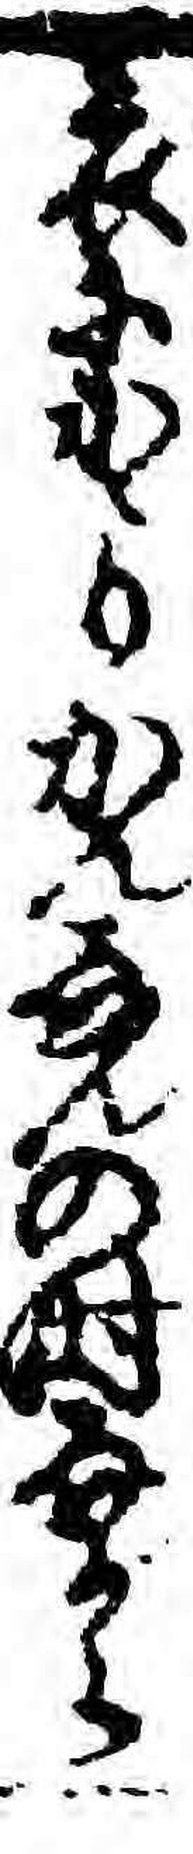衣にかゝりかんなんの時ながら
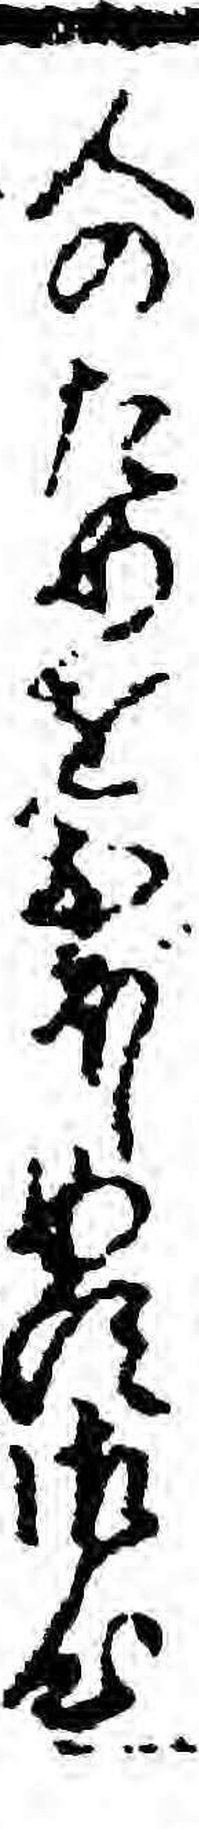人のためをおぼしめす御心
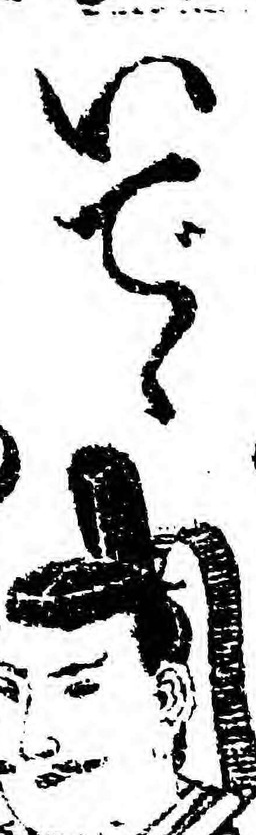いでゝ
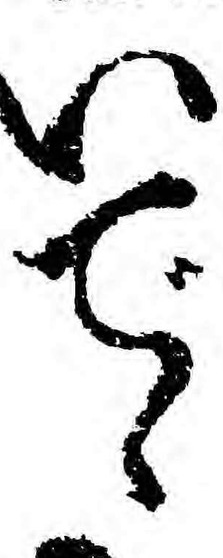いでゝ
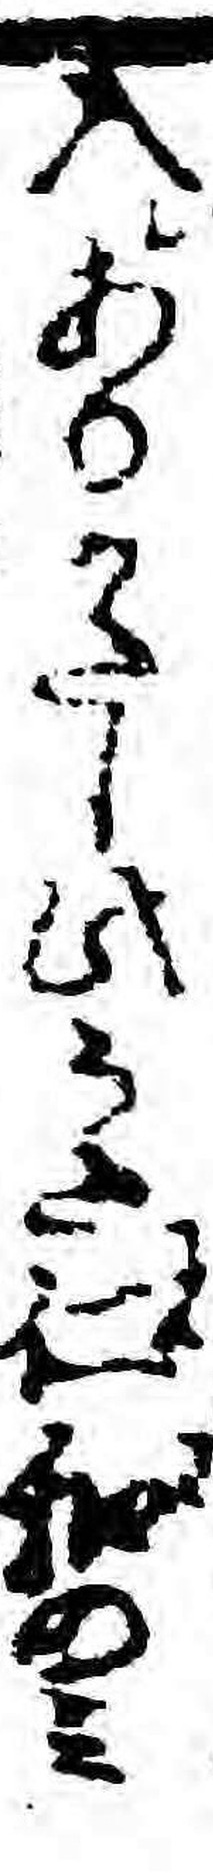入れありがたし此うた仁和のみ
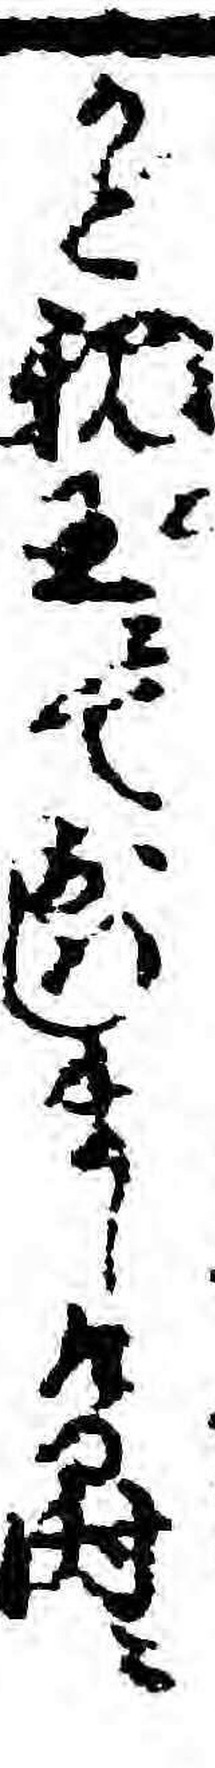かど親王にておはしましける時に
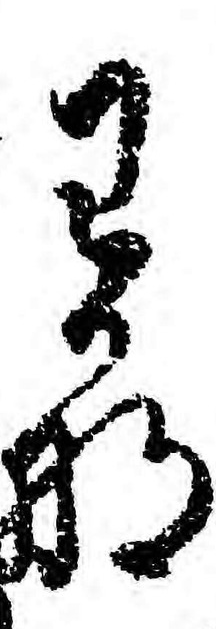わかな
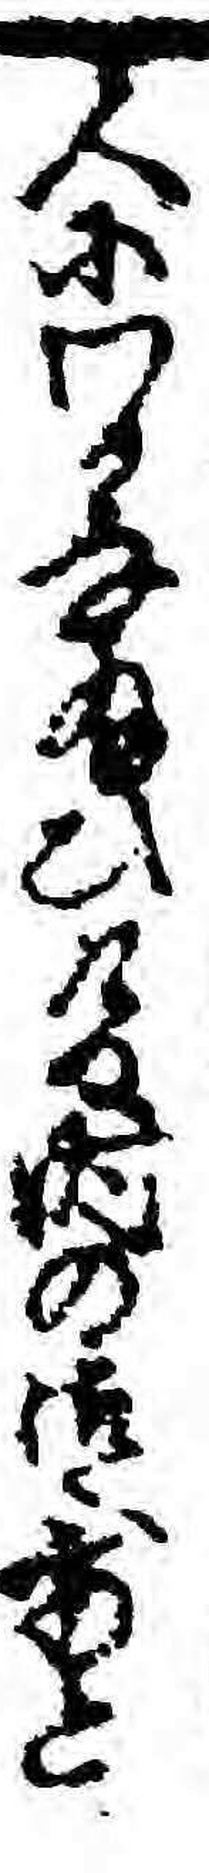人にわかな給ひける時の御哥と
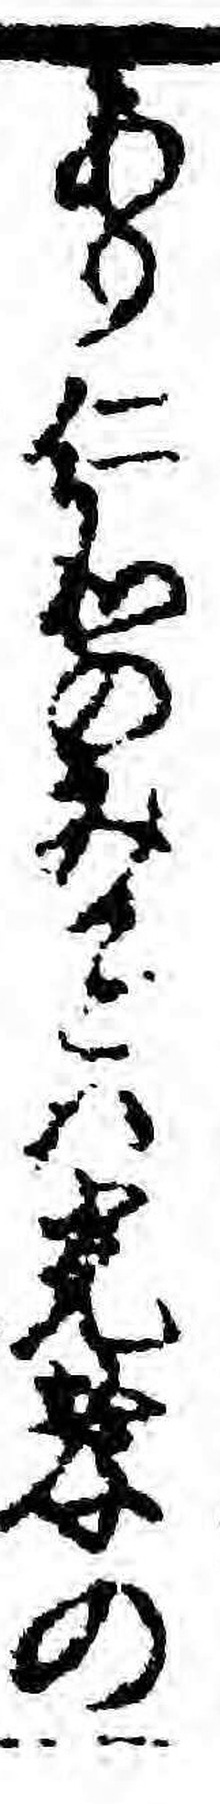あり仁和のみかどは光孝の
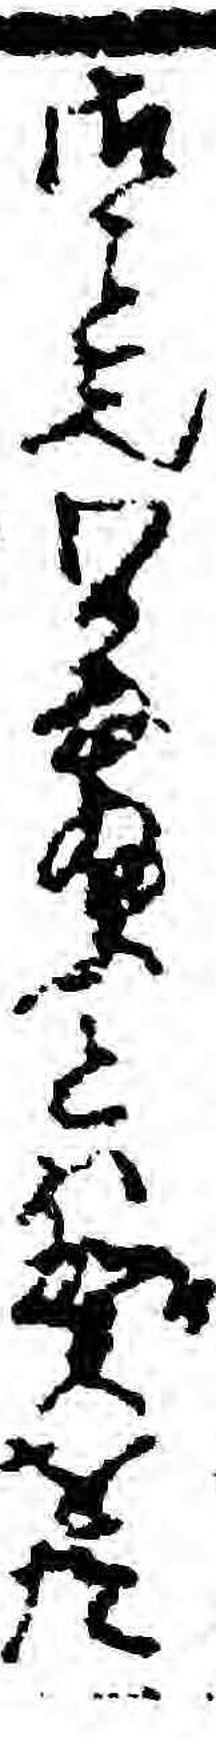御こと也わかな給ふとは賀をた
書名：頭書和歌注譯／壽賀多百人一首小倉錦
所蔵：国文学研究資料館
